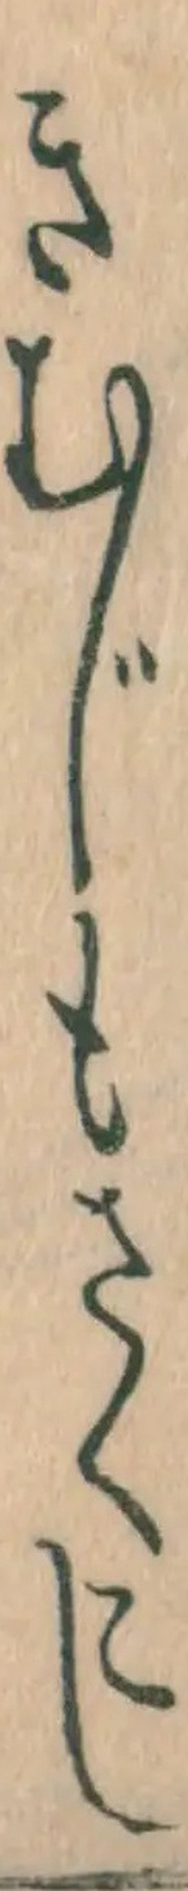きむじもさくこし
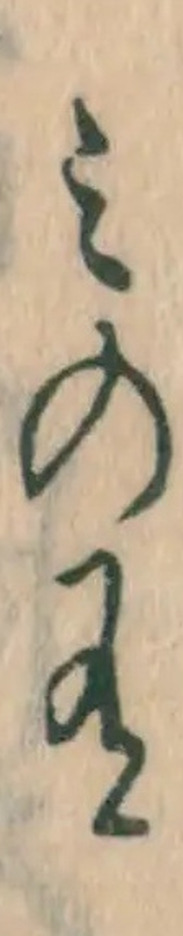みの有

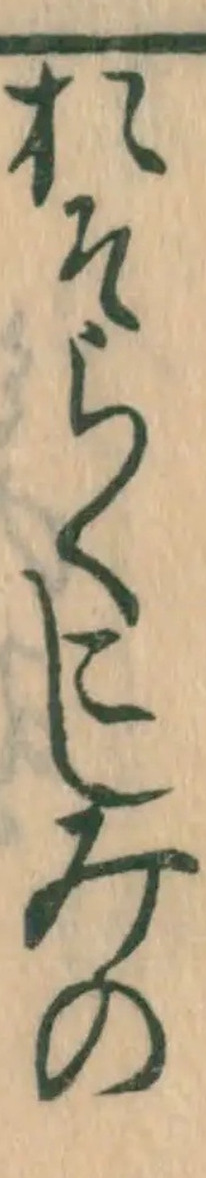おそらくこしみの
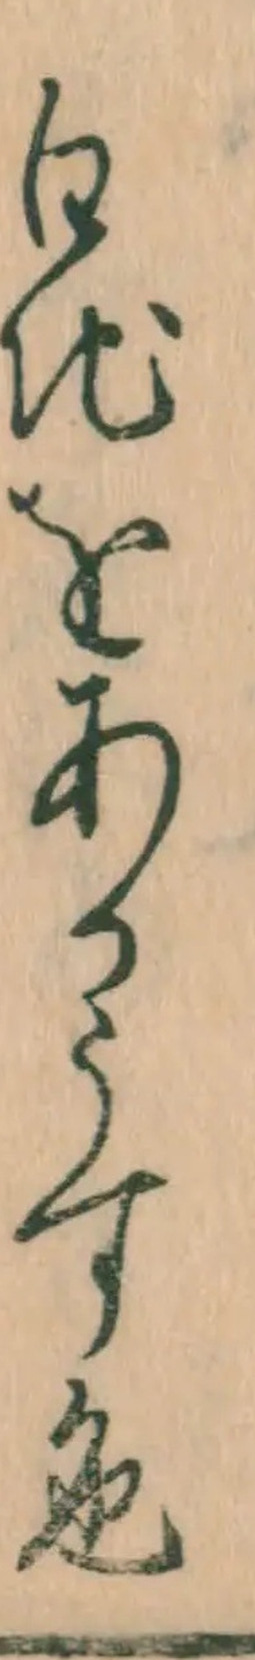白地をあかうす色
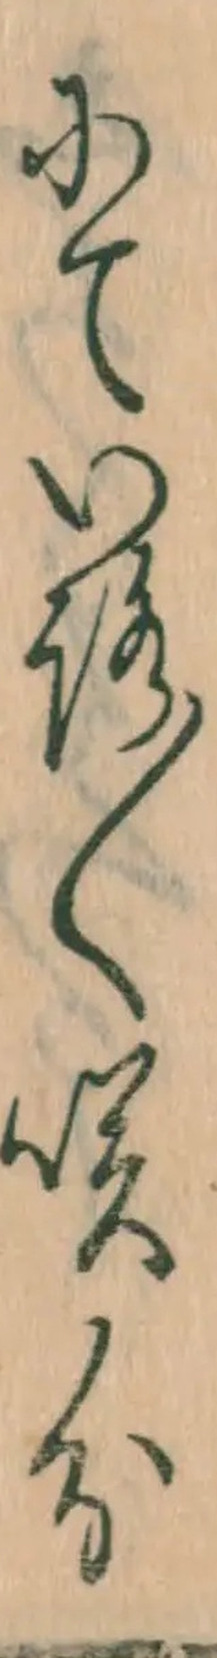にていろ〳〵咲分
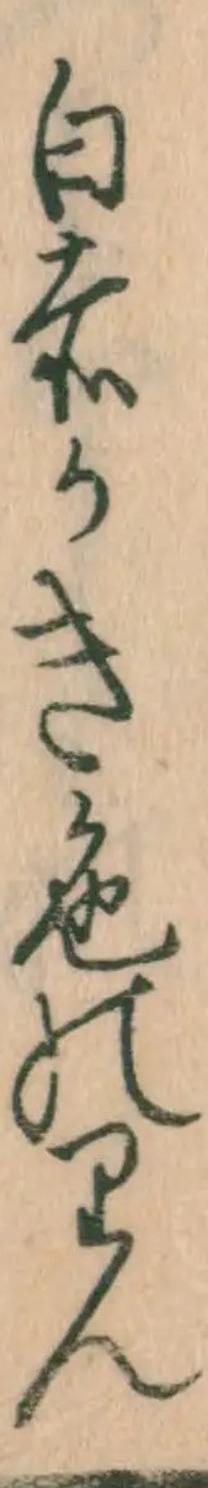白赤かき色のりん
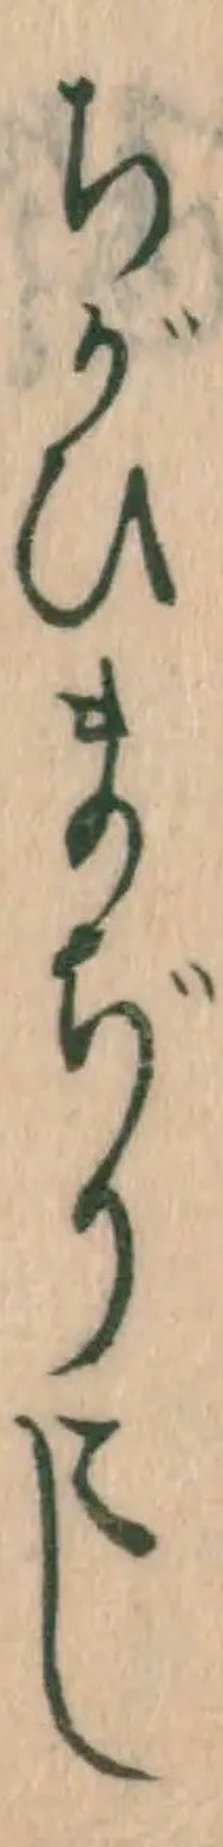ちがひまぢりこし
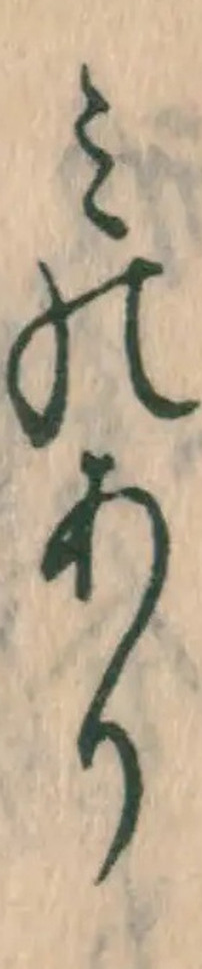みのあり
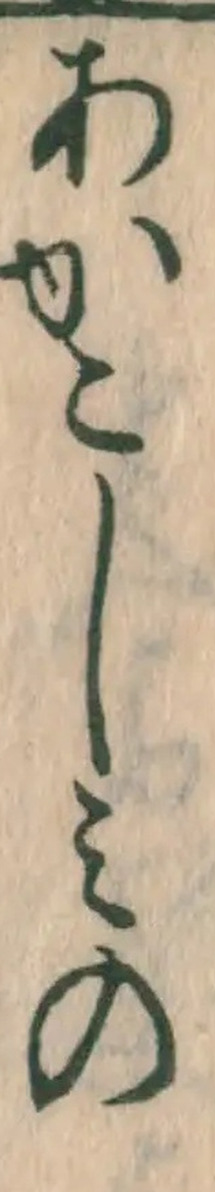●あかこしみの
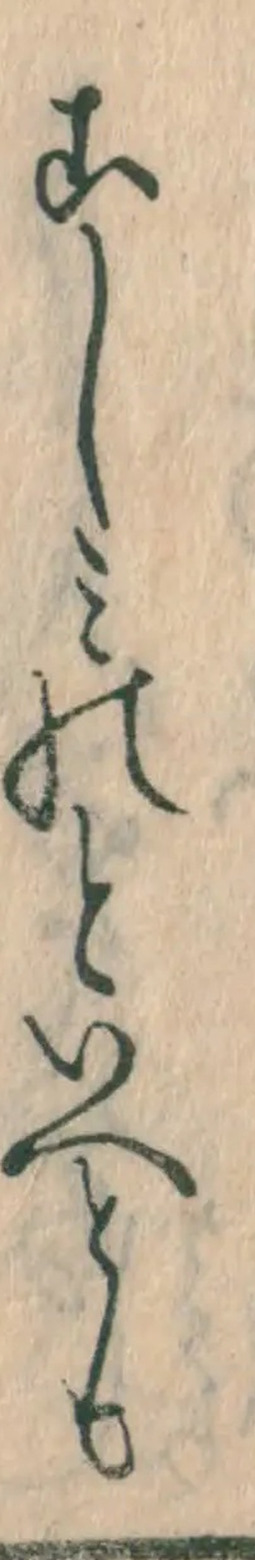こしみのといへとも

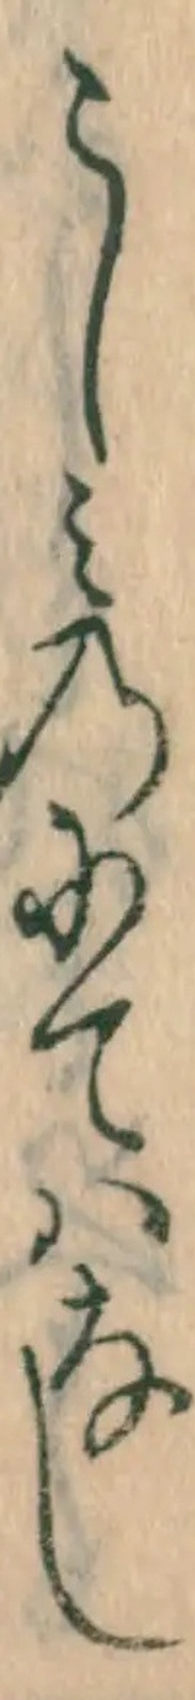こしみのにてはなし
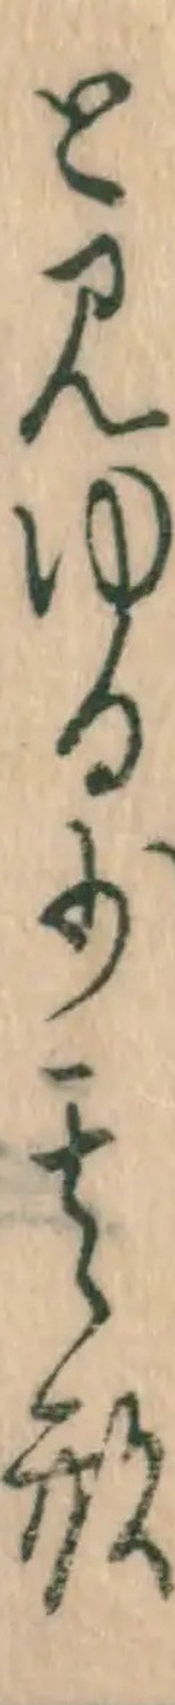と見ゆる少其形
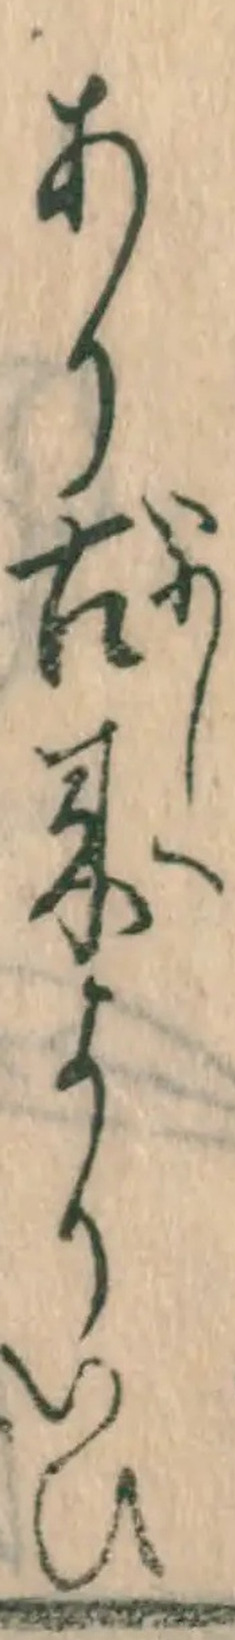あり古来よりいひ
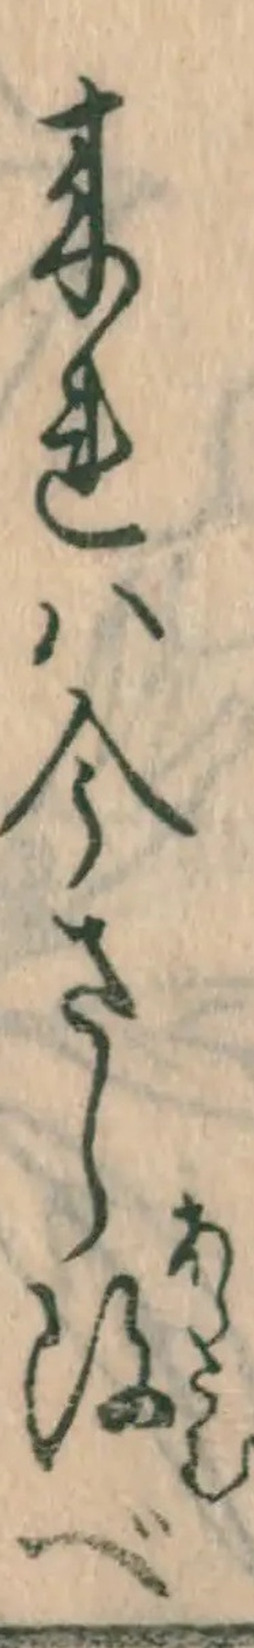来れは今さら改べ
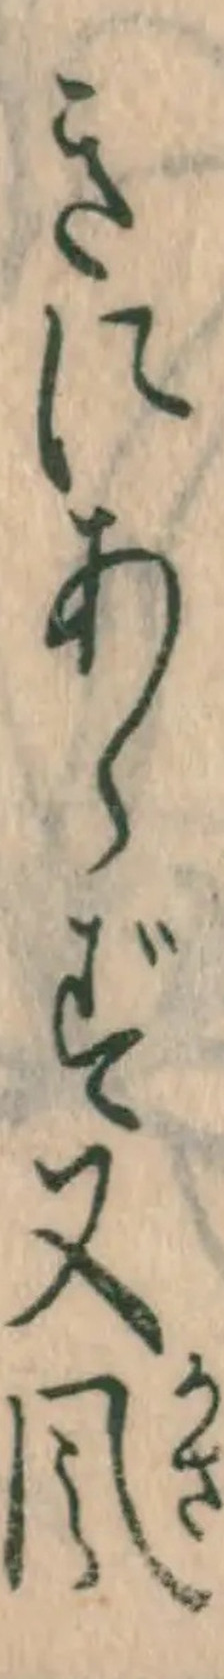にあらず又風
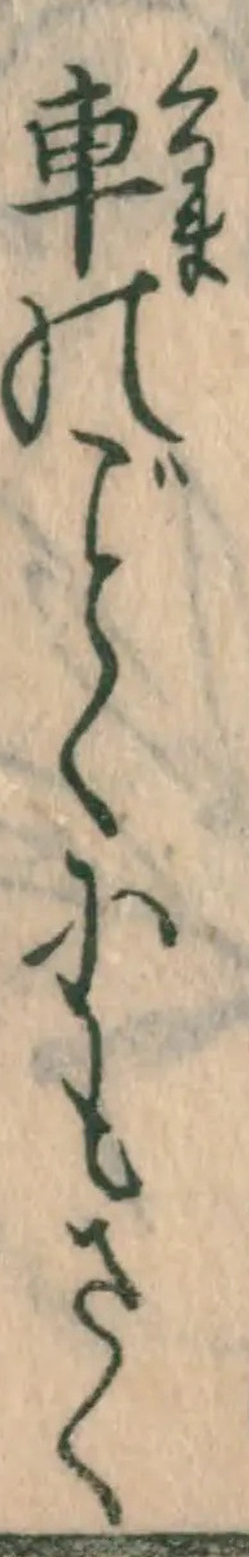車のごとくにもさく
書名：錦繍枕 5巻. [5]
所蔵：国立国会図書館 National Diet Library, JAPAN
